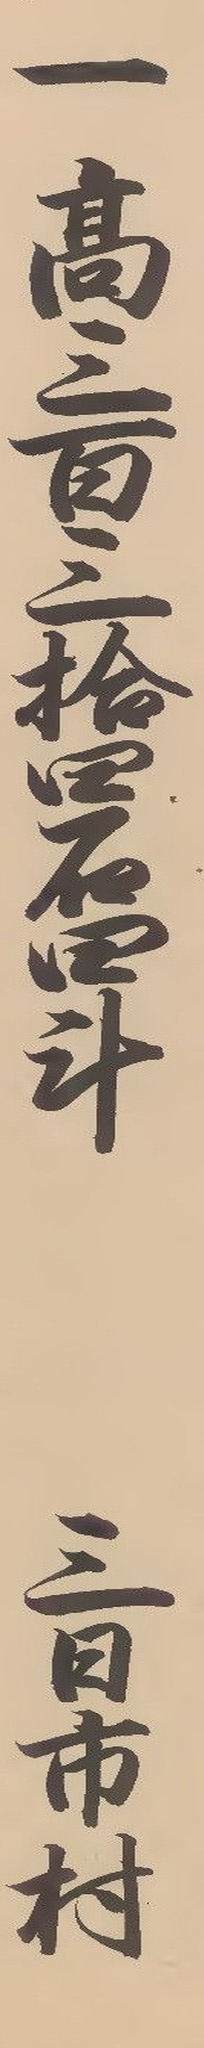一高三百三拾四石四斗三日市村
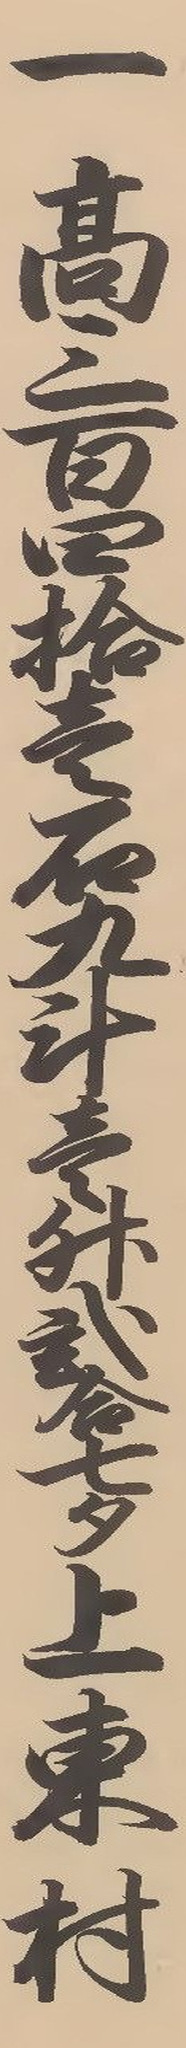一高三百四拾壱石九斗壱升弐合七勺上東村
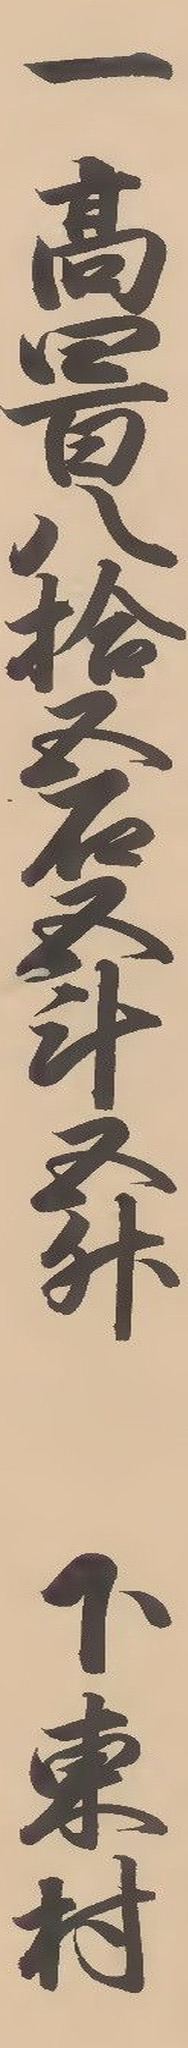一高四百八拾五石五斗五升下東村
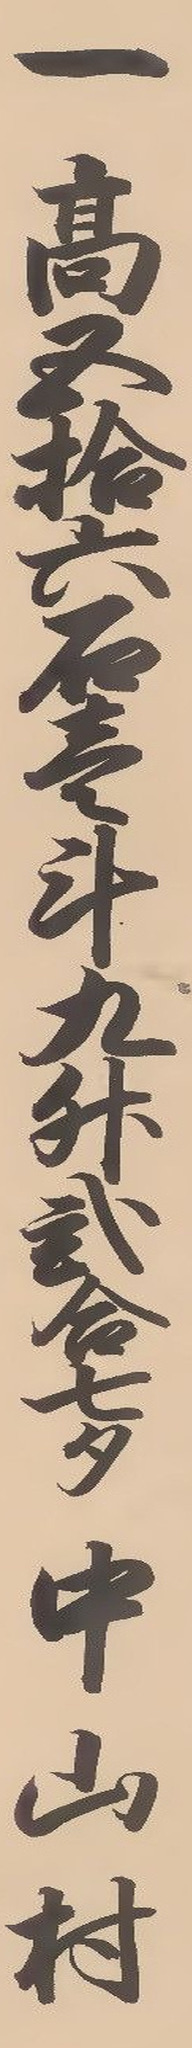一高五拾六石壱斗九升弐合七勺中山村
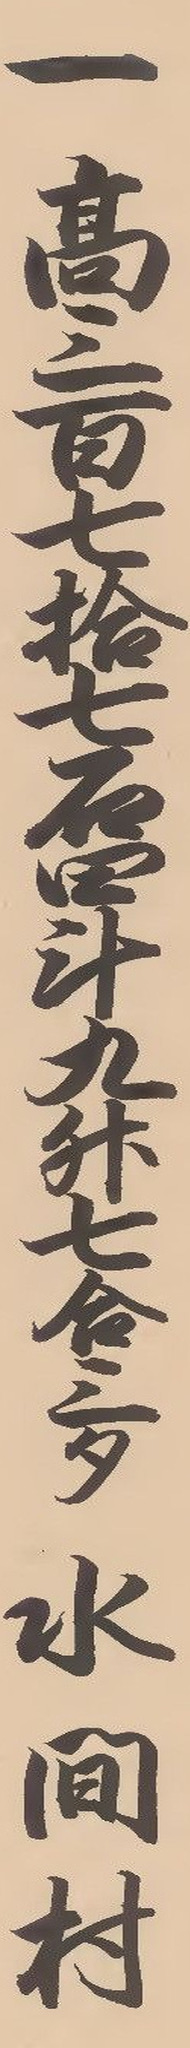一高三百七拾七石四斗九升七合三勺水間村
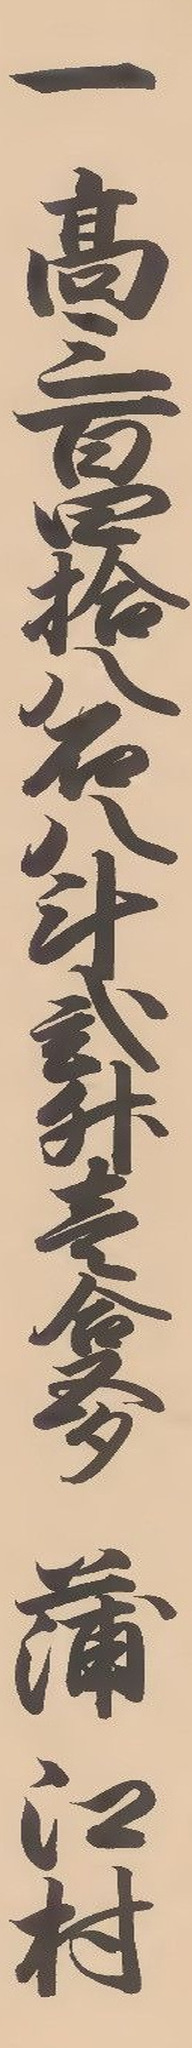一高三百四拾八石八斗弐升壱合五勺蒲江村
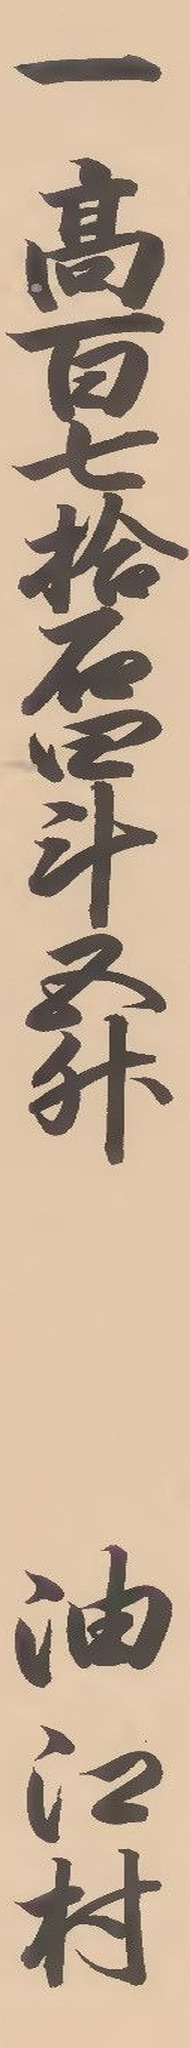一高百七拾石四斗五升油江村

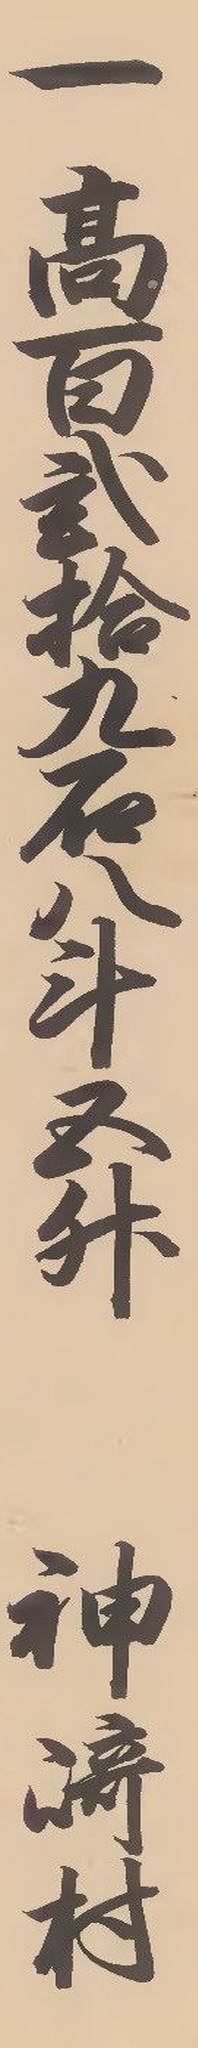一高百弐拾九石八斗五升神崎村
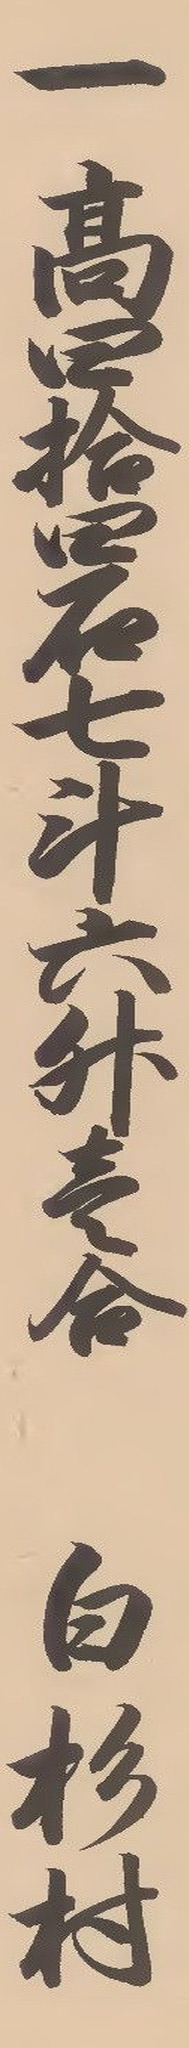一高四拾四石七斗六升壱合白杉村
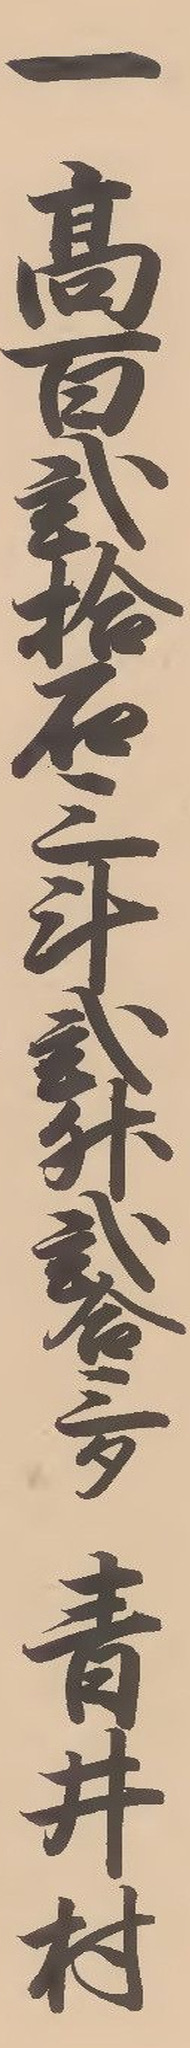一高百弐拾石三斗弐升弐合三勺青井村
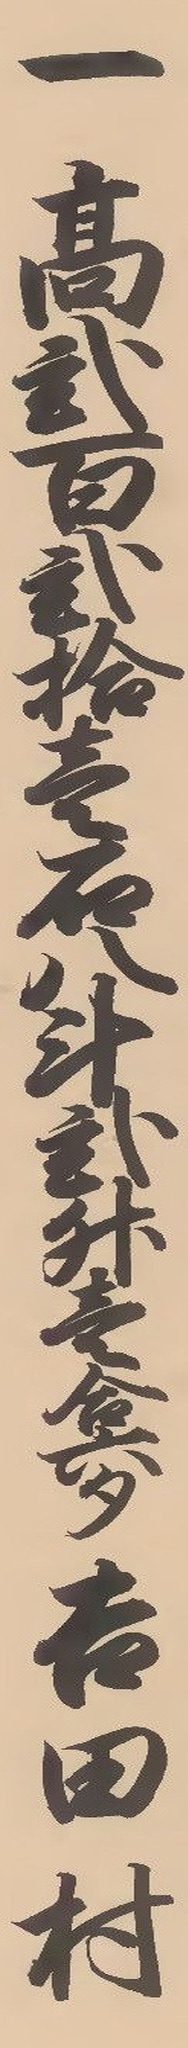一高弐百弐拾壱石八斗弐升壱合六勺吉田村
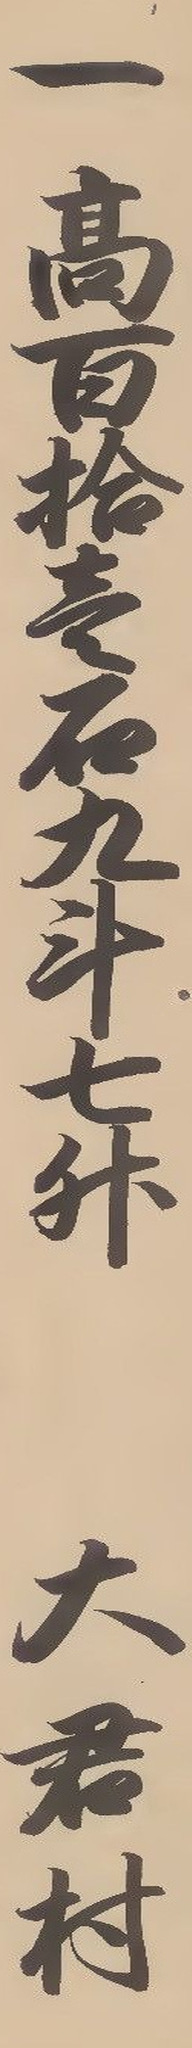一高百拾壱石九斗七升大君村
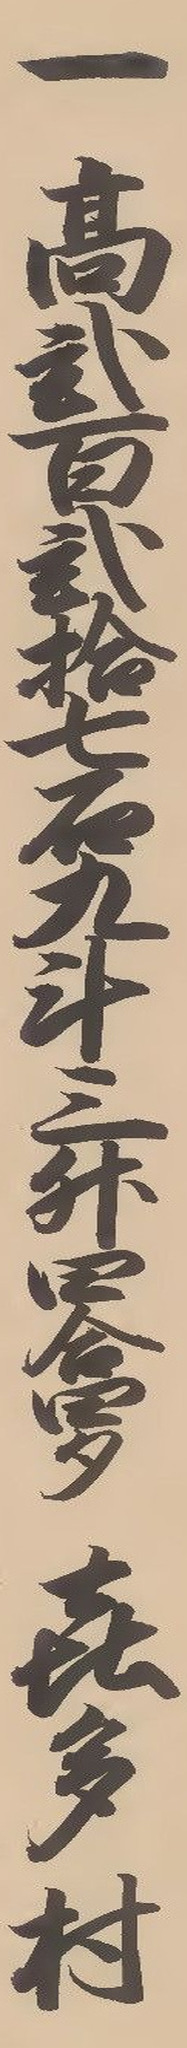一高弐百弐拾七石九斗三升四合四勺喜多村
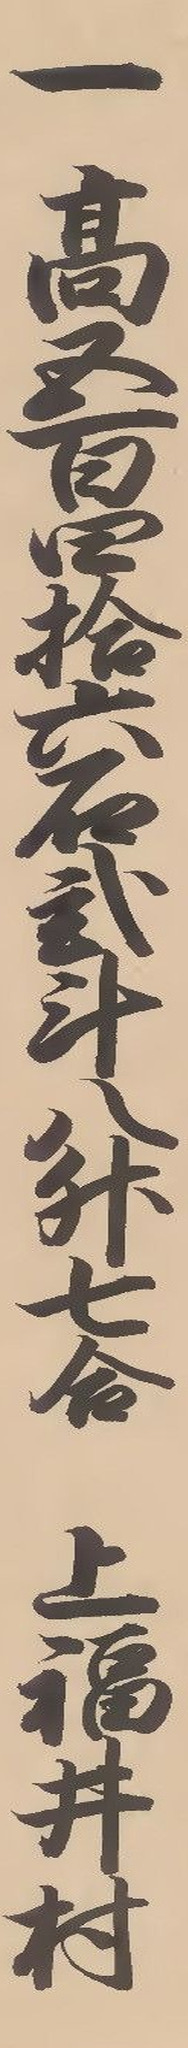一高五百四拾六石弐斗八升七合上福井村
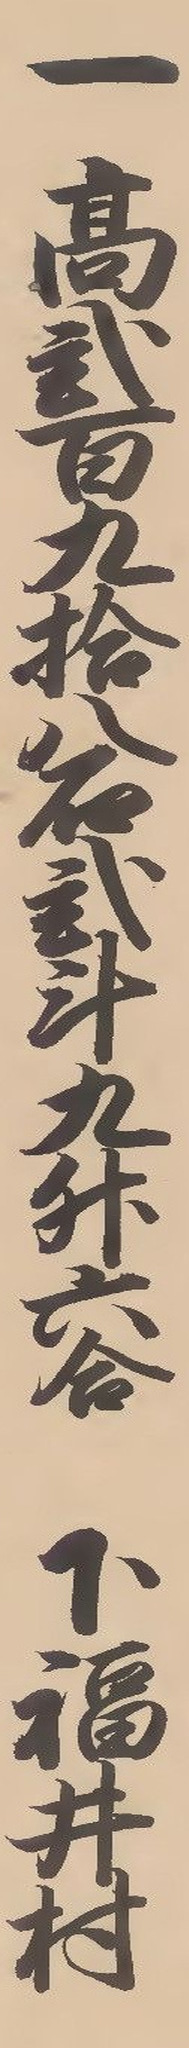一高弐百九拾八石弐斗九升六合下福井村

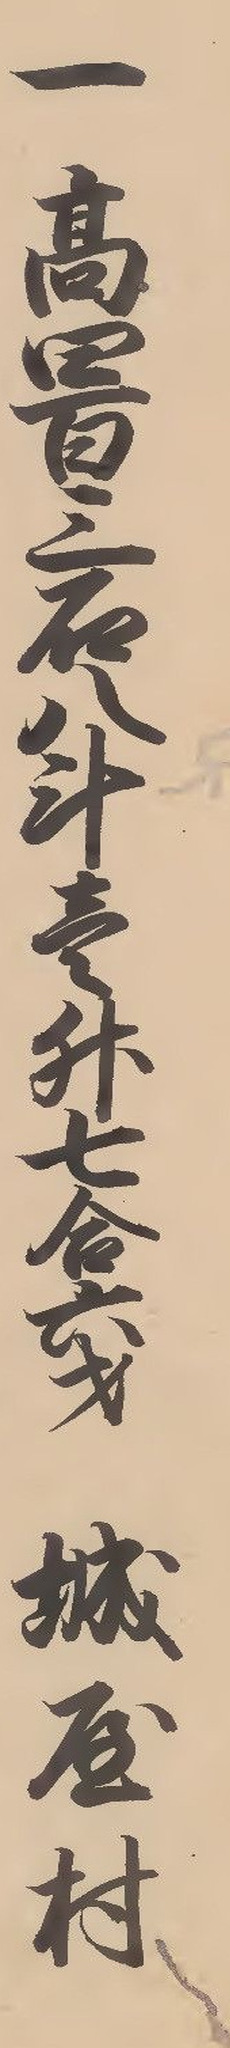一高四百三石八斗壱升七合六才城屋村
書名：丹後国郷帳
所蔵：国立公文書館 National Archives of Japan
